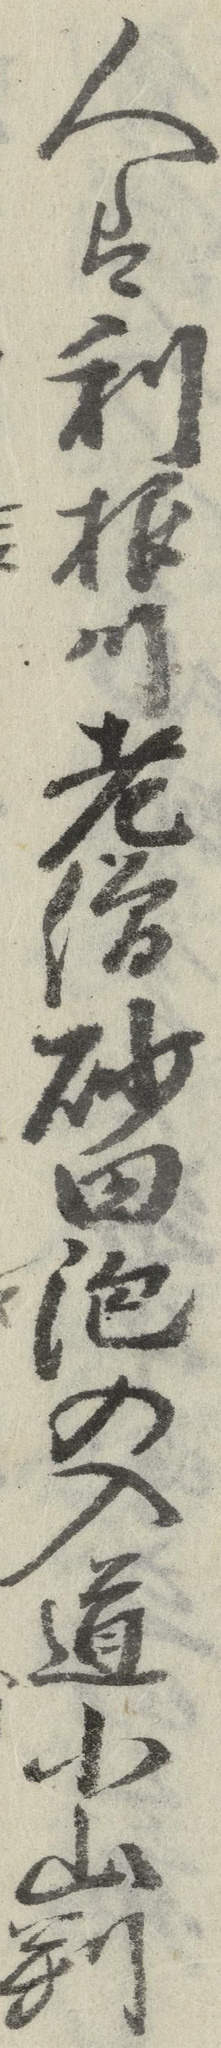人は利根川老僧砂田泡の入道小山判
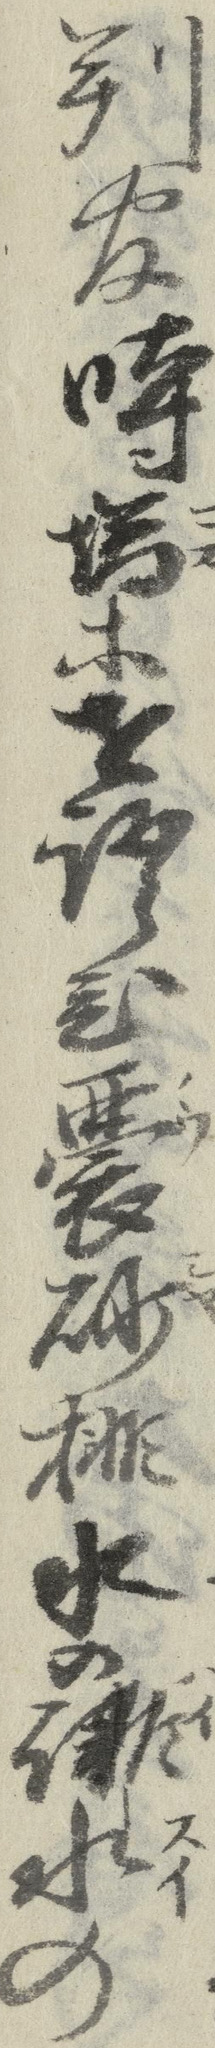判官時塲等を語らひ嚢砂排水の碓氷の
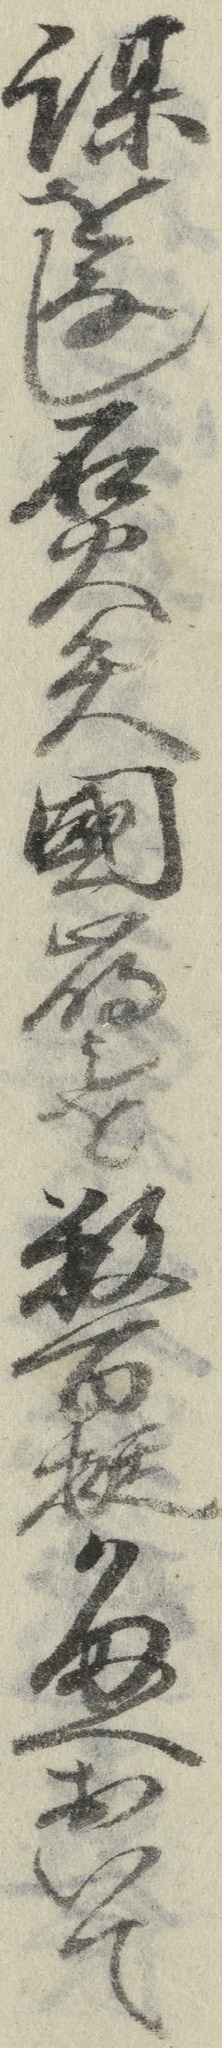謀をなし石火失国崩シを数百挺かまへおいて
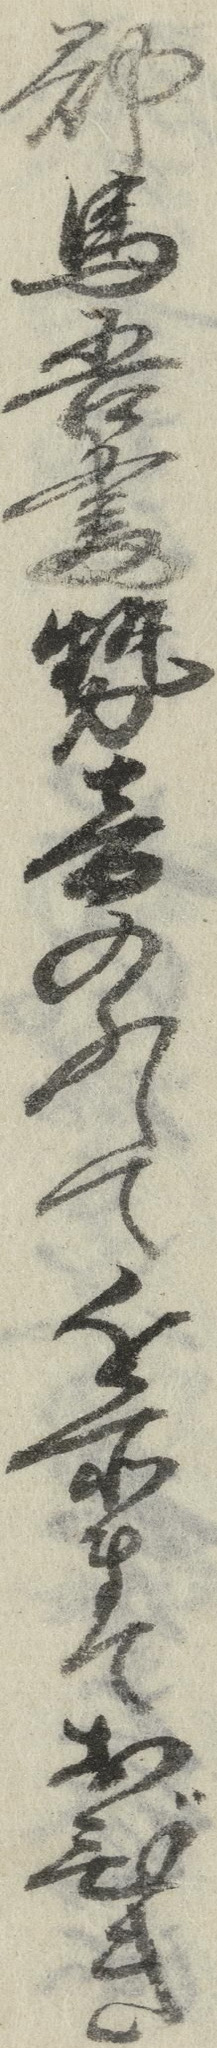郡馬吾妻勢音のふして近所まておびき
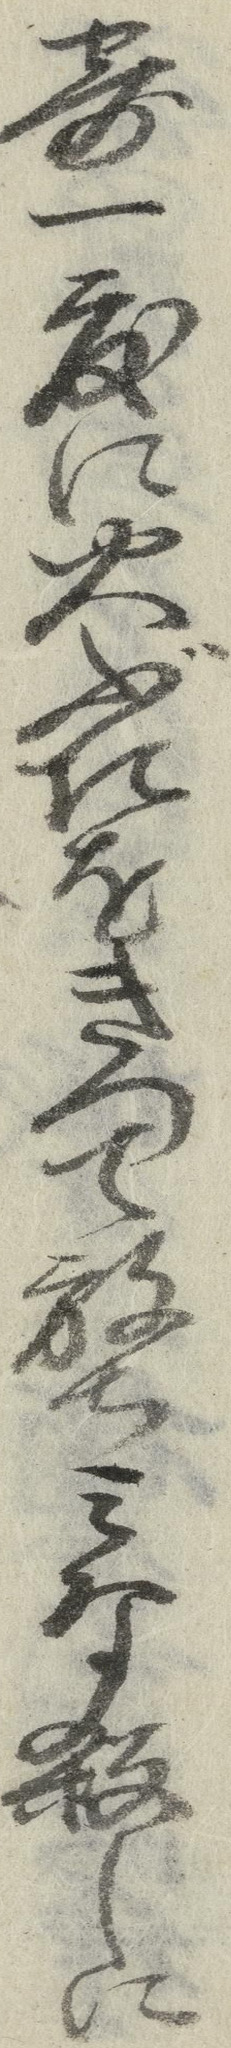寄一度に火ぶたをきつて放ちみな殺しに
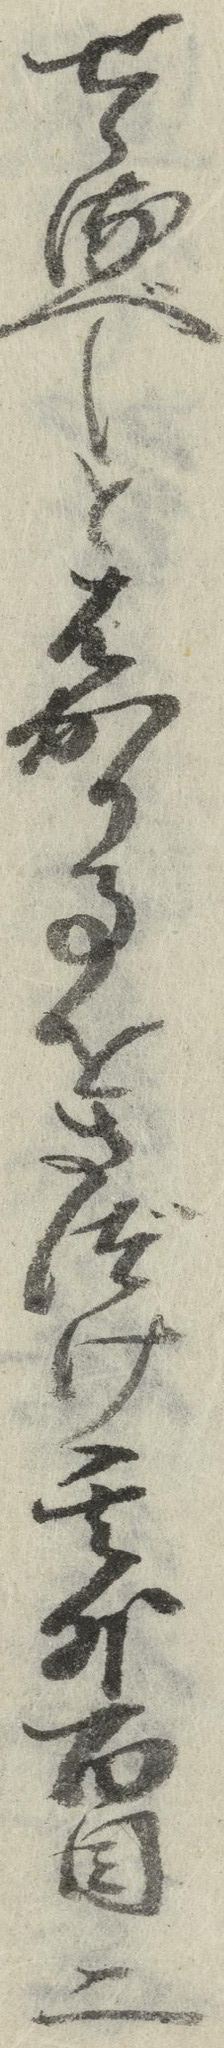せらるべしとはかり事をさずけ其外百目二
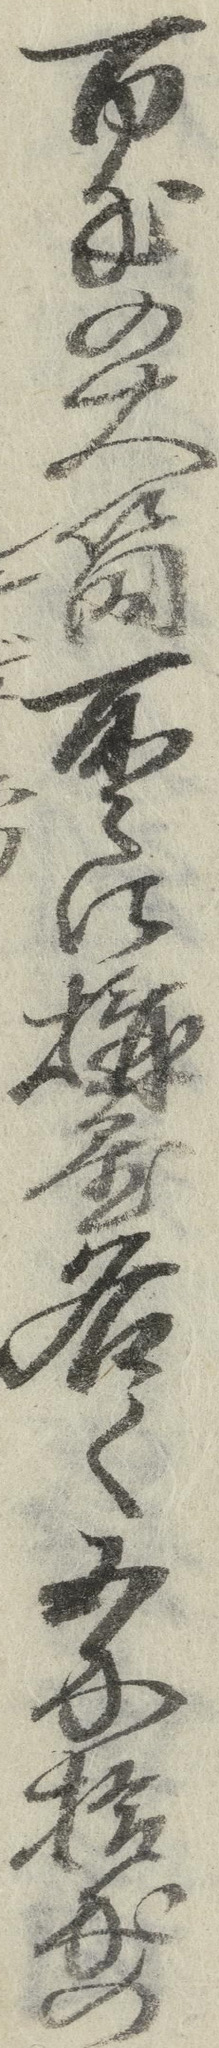百匁の大筒所々に構置各々五匁拾匁の
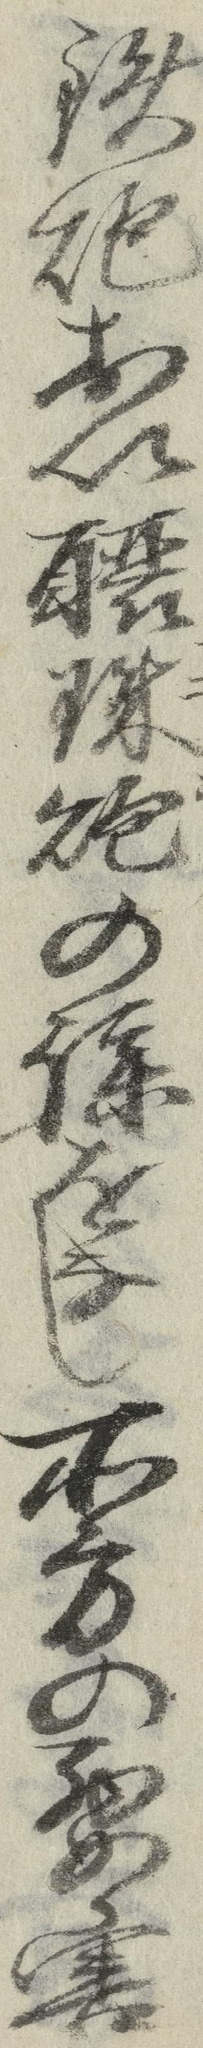鉄炮お以聯殊炮の謀をなし所方の要害
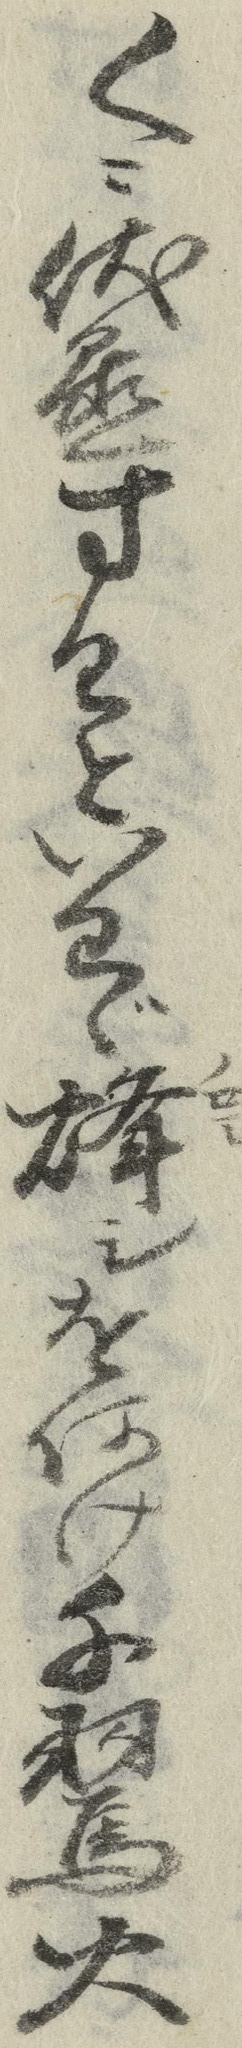〳〵に伏置すわといわゞ烽シをあけ千羽馬火
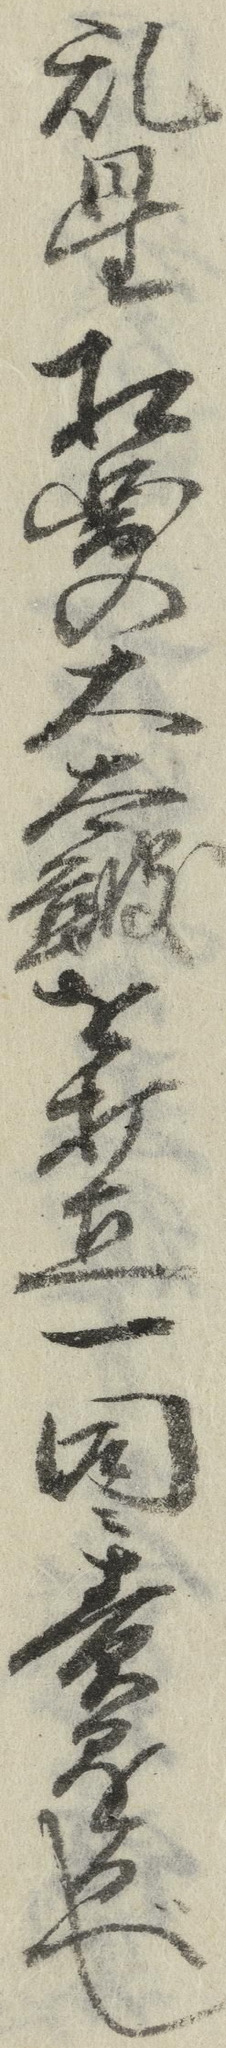乱星相図の大太鼓を打立一同に責懸るべし

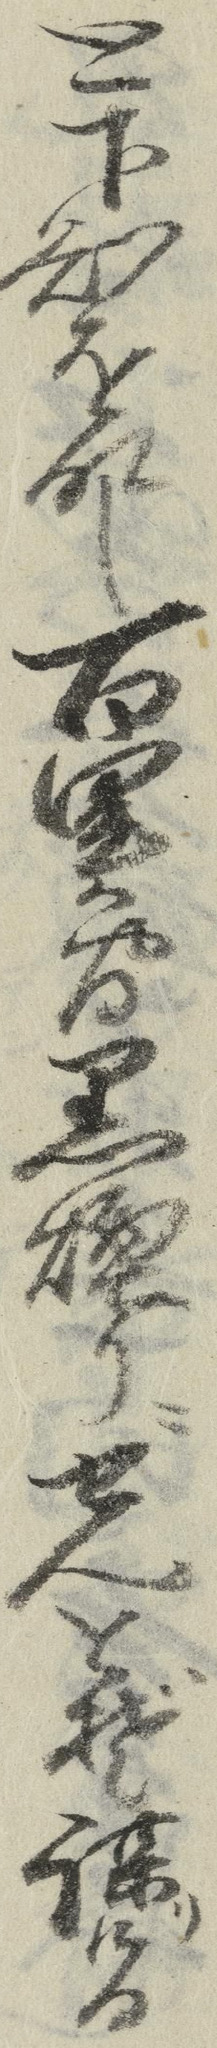と下知をなし百里の間黒煙りにセんとぞ謀
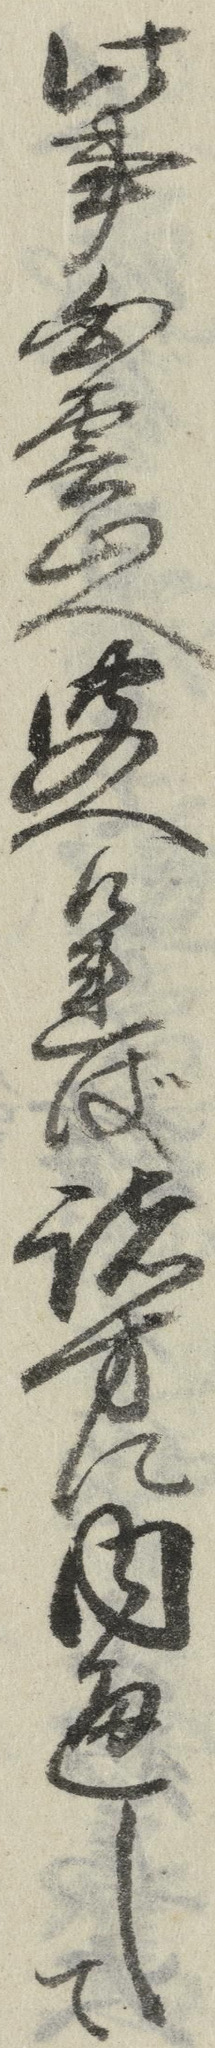此事白雲山へ聞へければ諸方に内通して
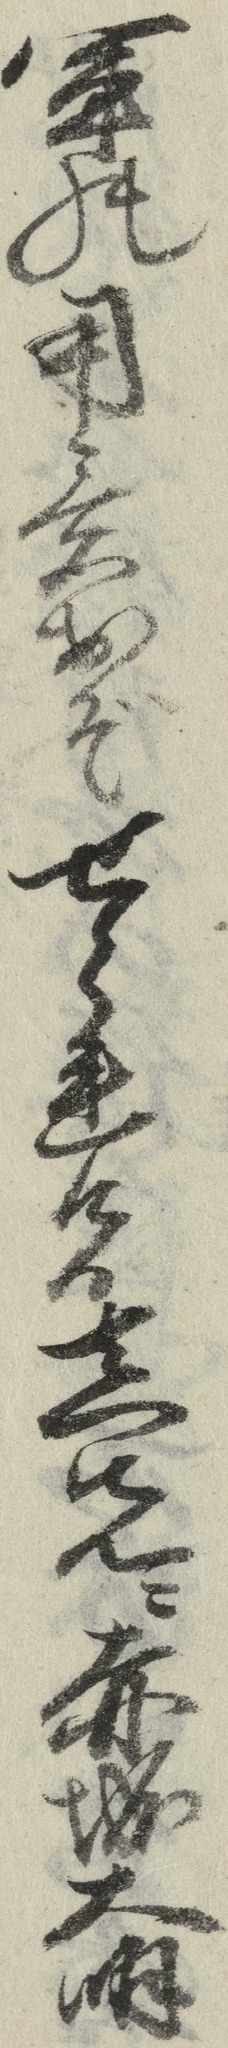軍の用無おぞせられける真先に赤城大明
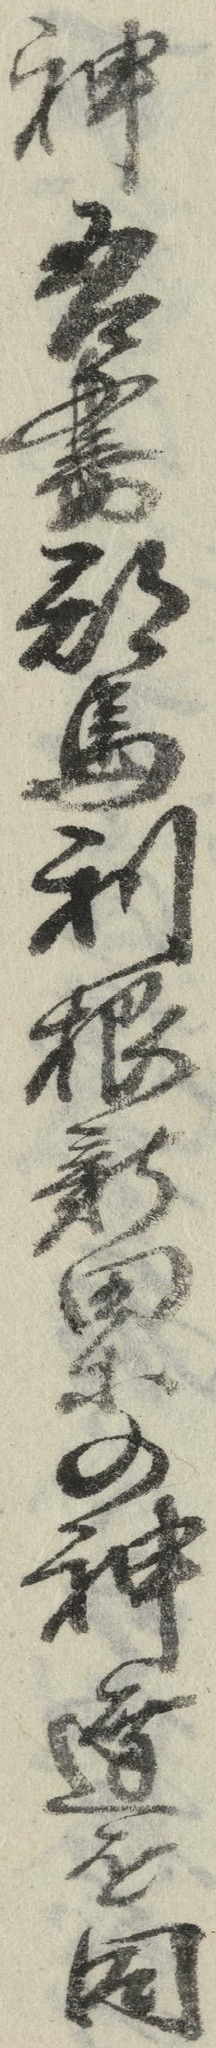神吾妻郡馬利根新田等の神達を同
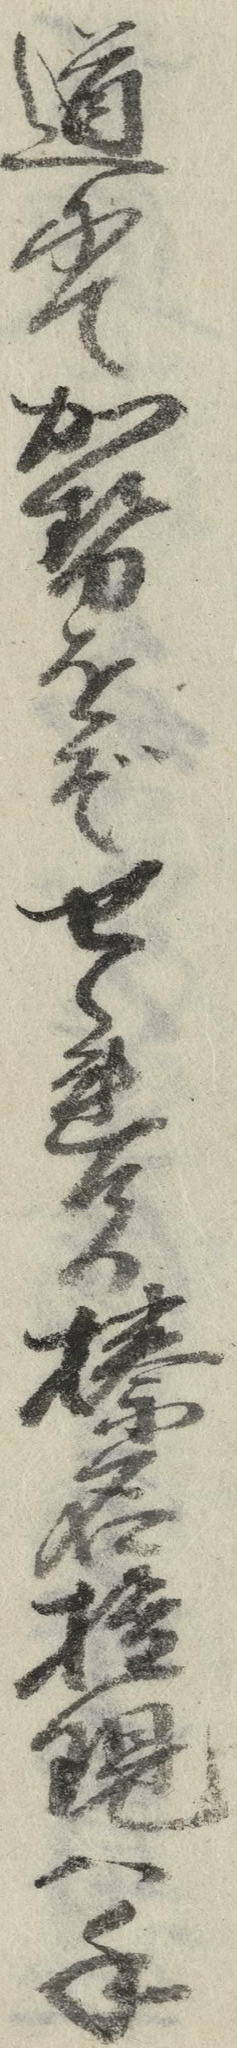道にて加勢をぞせられける榛名権現は手
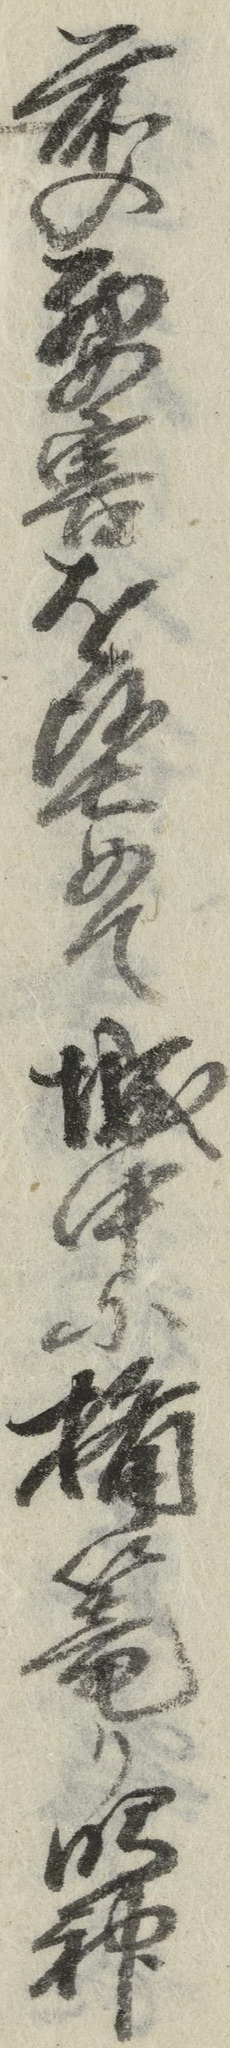前の要害を堅めて城中に楯篭り鳴神
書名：浅間大焼騒動記　上
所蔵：東京大学地震研究所図書室 Earthquake Research Institute Library, The University of Tokyo, JAPAN
